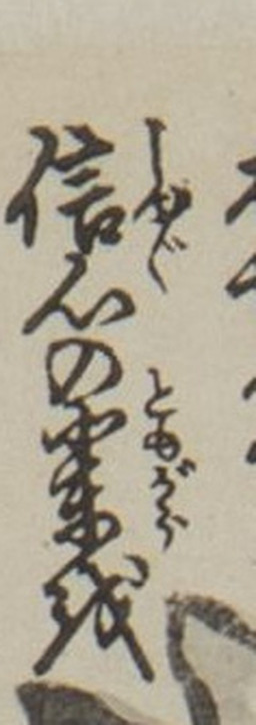信心の輩を
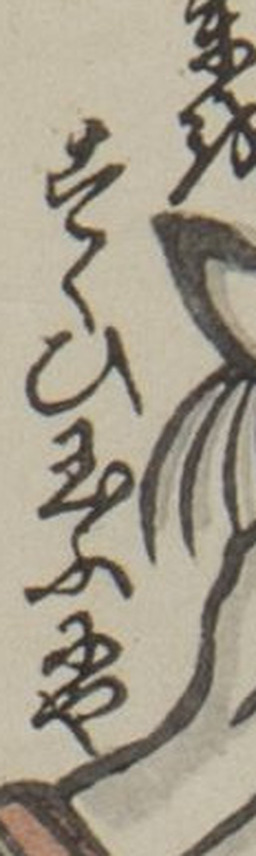すくひ玉ふにや
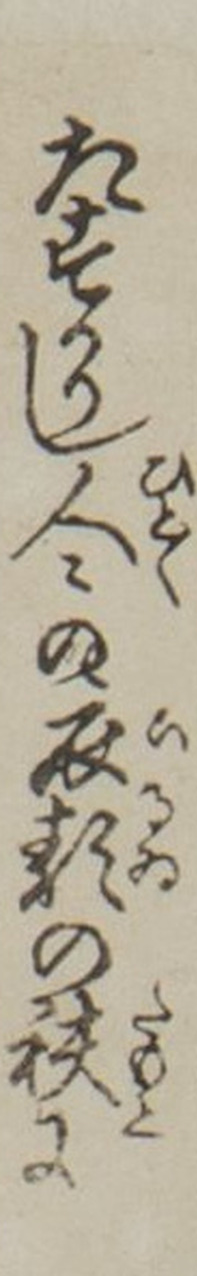たすかりし人々の衣類の袂に
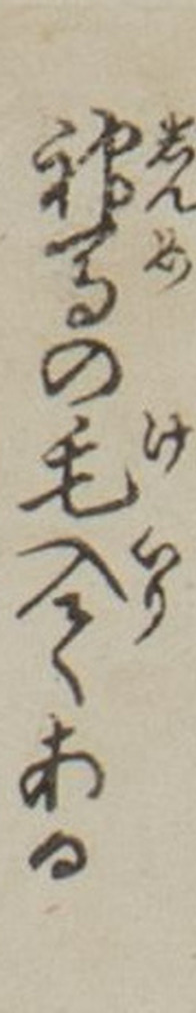神馬の毛入てある
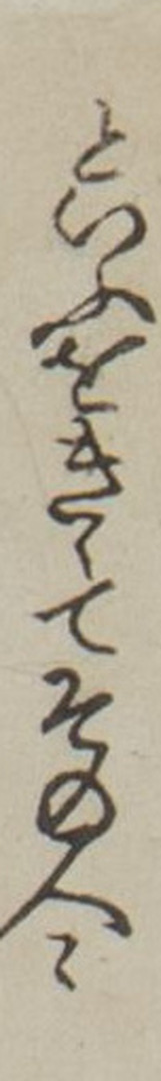といふをきゝてその人々
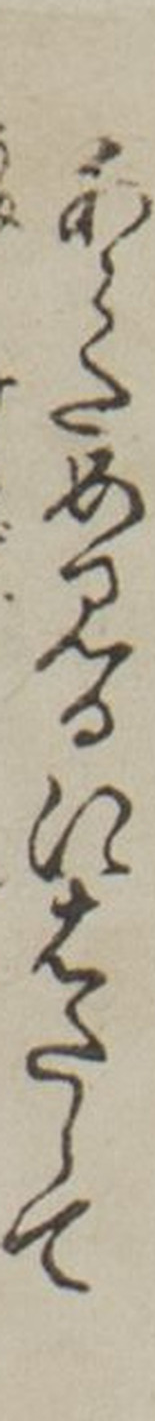あらため見るにはたして
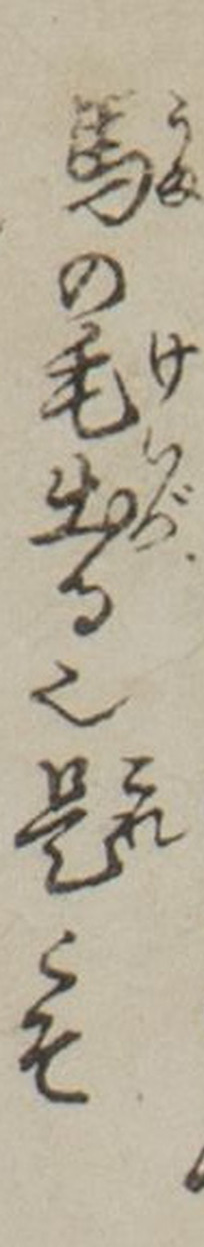馬の毛出る也是こそ
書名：鯰を蹴散らす伊勢神宮神馬
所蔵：あいおいニッセイ同和損保株式会社
